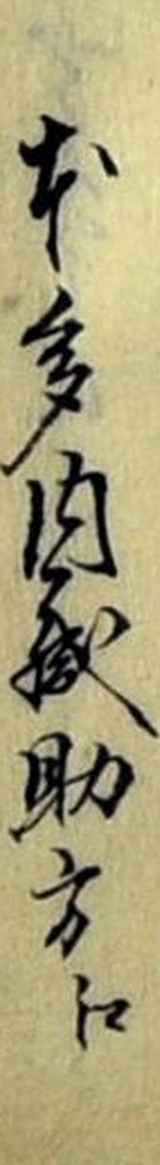本多内蔵助方へ
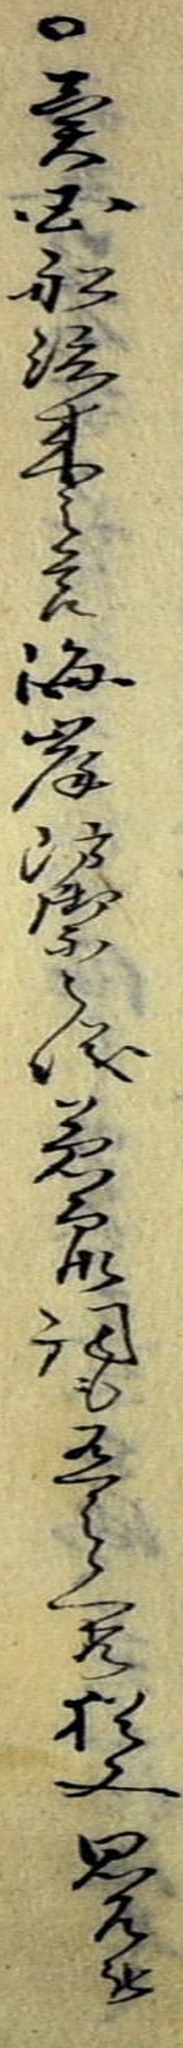○異国船渡来之節海岸防禦之儀兼而御調も有之候へ共猶又思召被

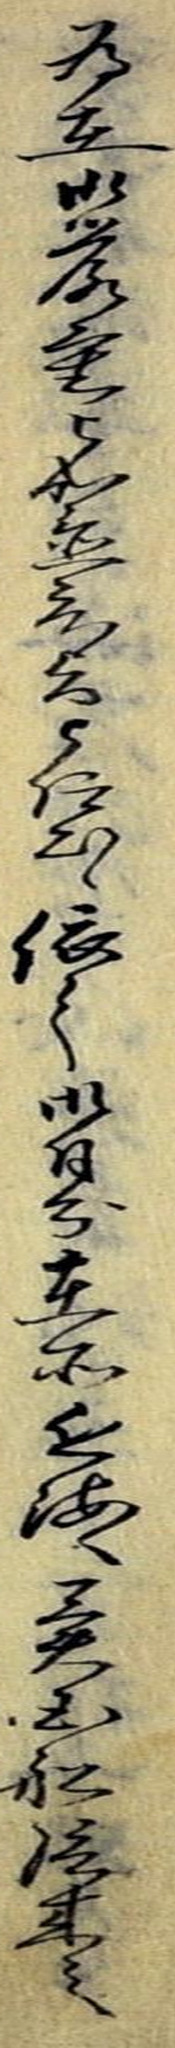為在御厳重被成置度旨被仰出候依之御自分在所近海へ異国船渡来之
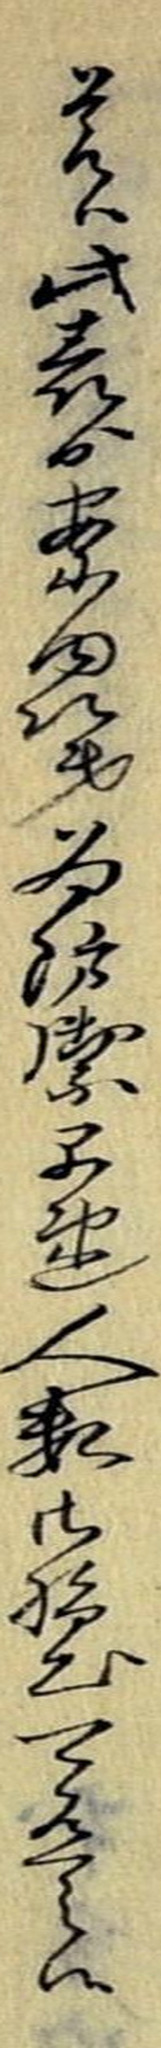節は此表ゟ案相次第為防禦早速人数御指出可有之候
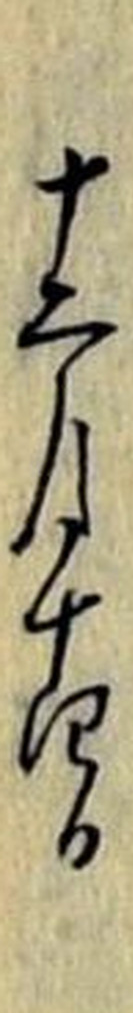十二月十四日
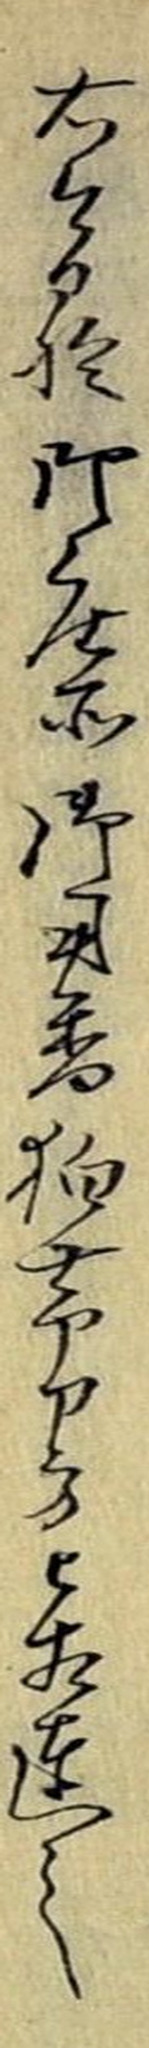右今日於御座所御用番狛帯刀方被相達之
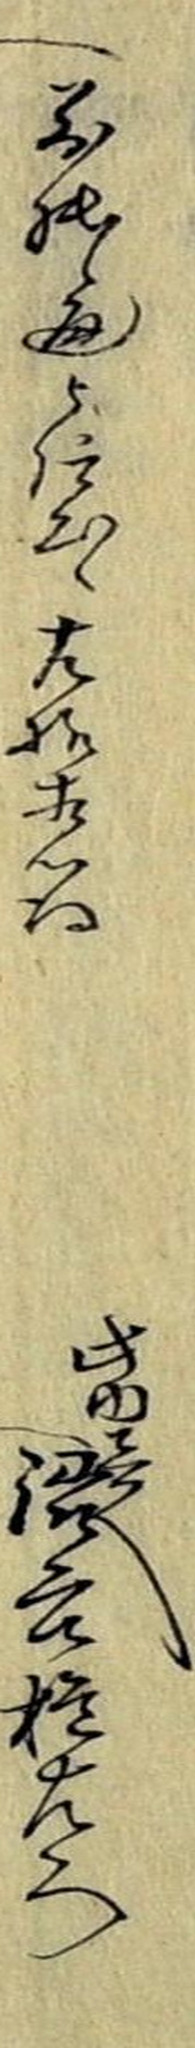別紙之通被仰出候左様相心得渋谷権左衛門
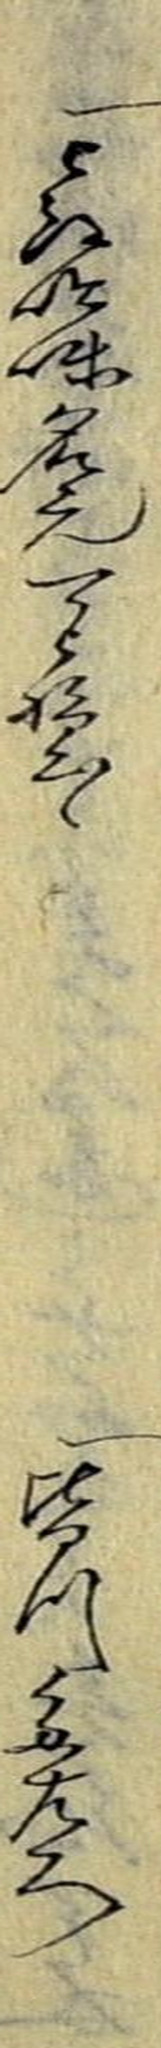被為吟味名元可被指出候皆川多左衛門
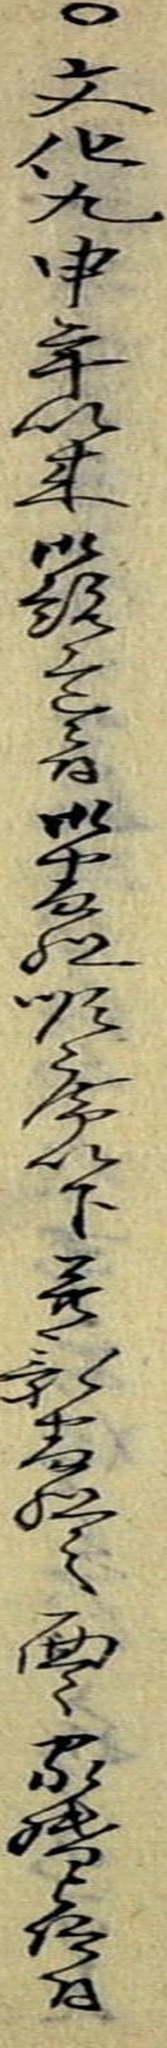○文化九申年以来御趣意に付御番組順席以可井新番組之面々家督被仰付
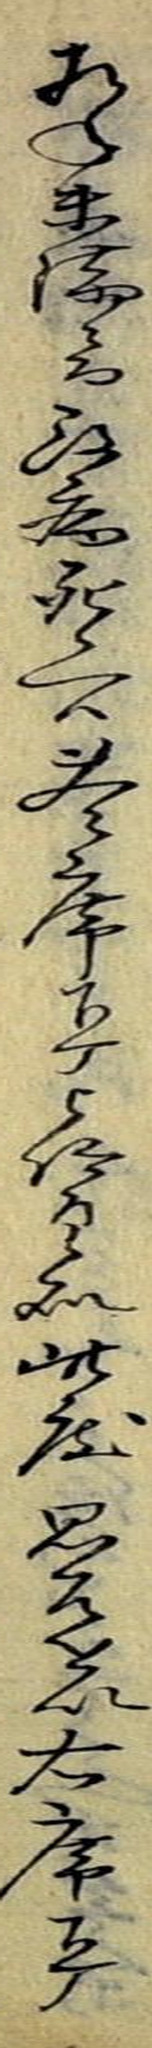拾年未満に而致病死候へは夫々席下ヶ被仰付候処此度思召を以右席下ヶ
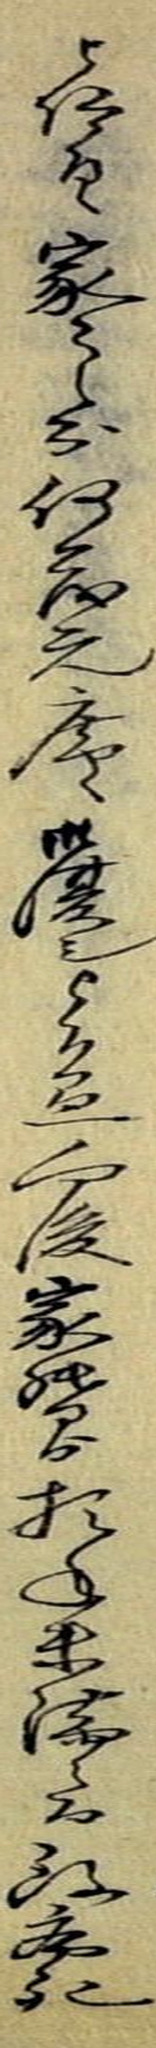被仰付候家々之分何も元席へ御復し被下置向後家督ゟ拾年未満に而致病死
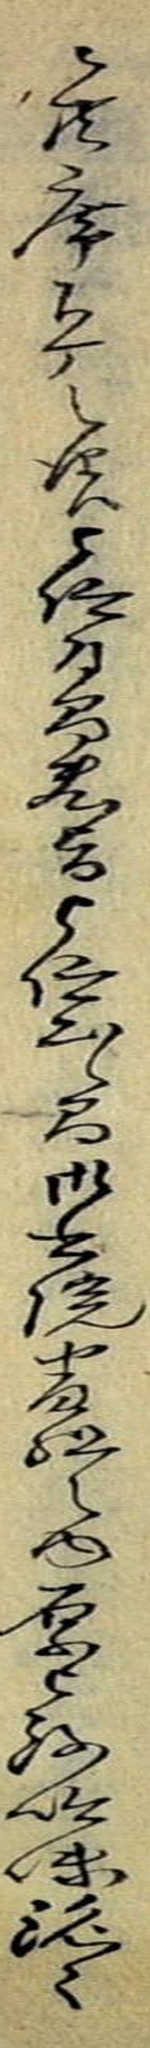候共席下ヶ之儀は被仰付間敷旨被仰出候間御書院番組之内厚被致吟味銘々
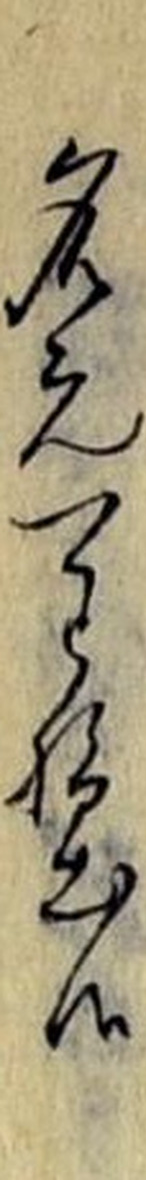名元可指出候
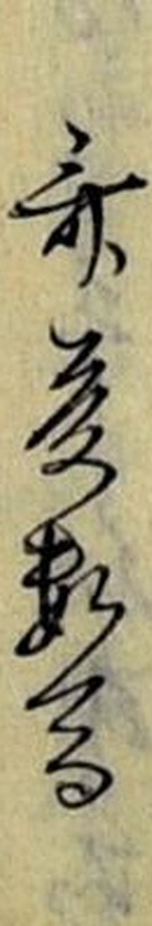斉藤数馬
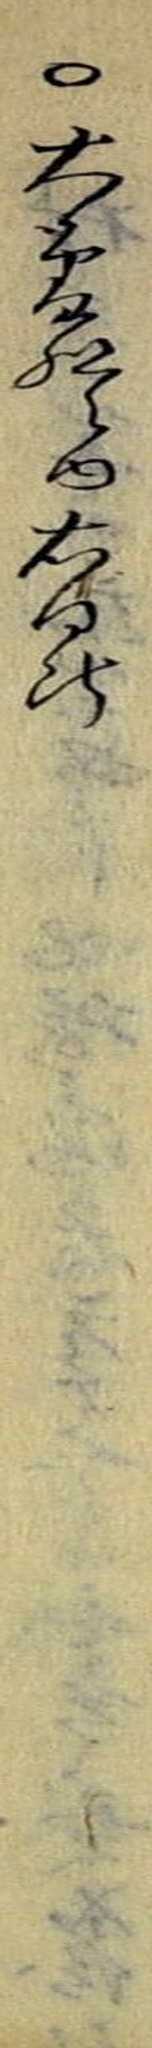○大御番組之内右同断
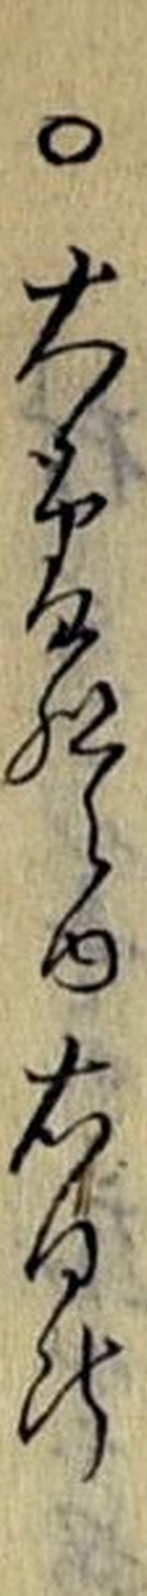○大御番組之内右同断
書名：命令之部 六
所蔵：福井県文書館 Fukui Prefectural Archives
